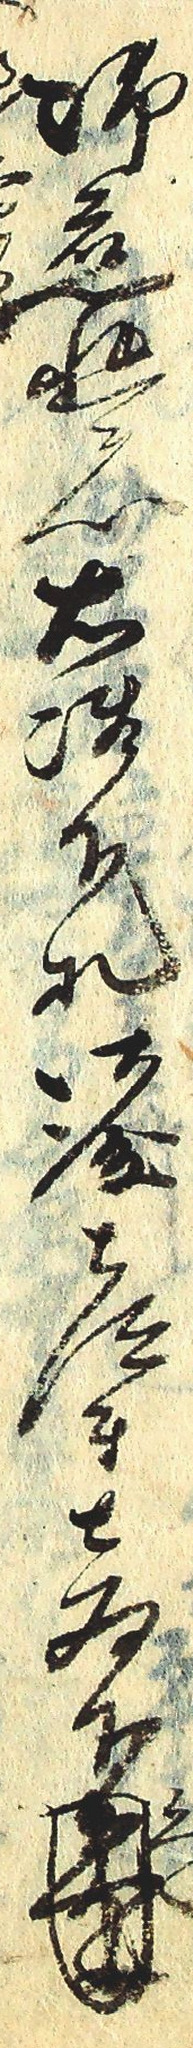御慈悲を以右御下札御渡被仰付被為下候はゝ
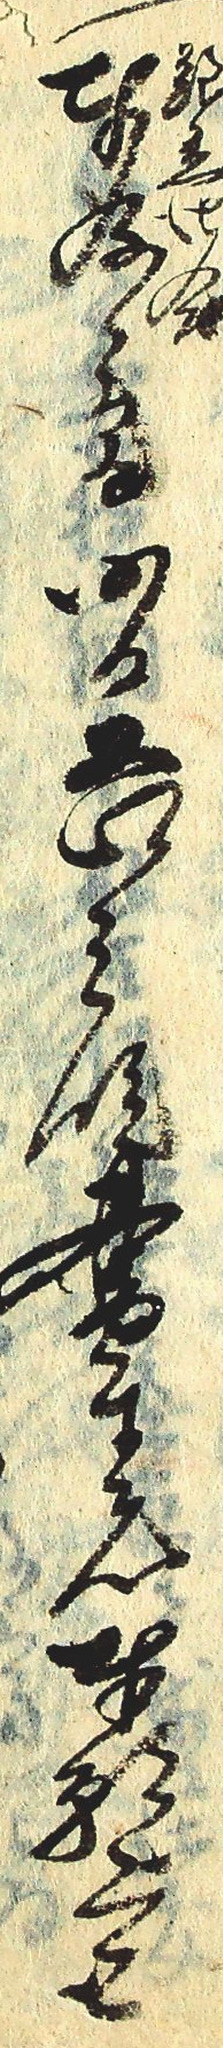奉存候間仍て右之段書付を以奉願上候以上
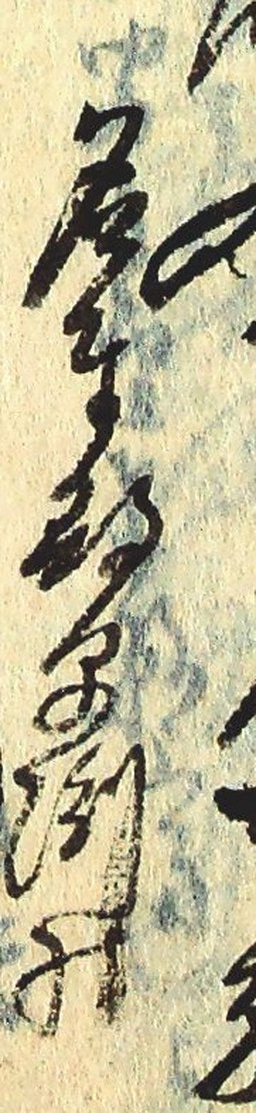名東郡早淵村
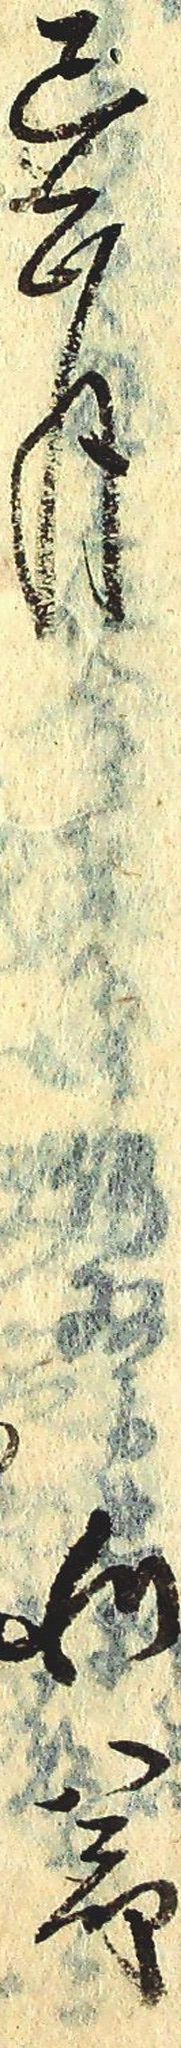巳正月利八郎
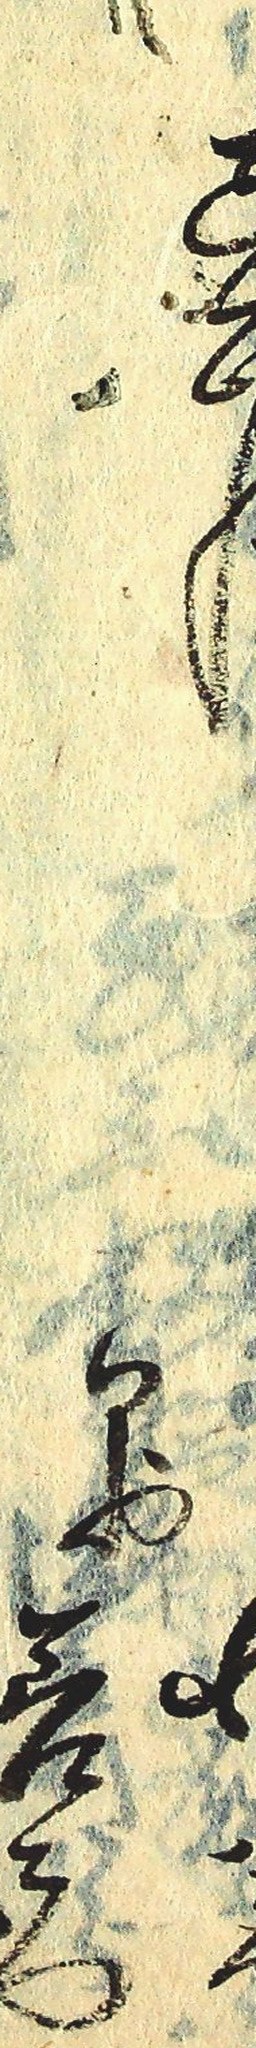同村善右衛門
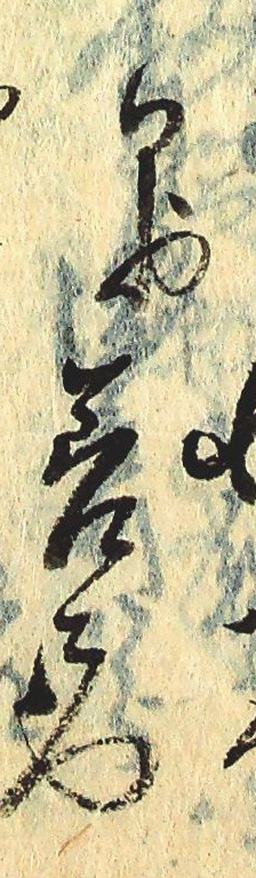同村善右衛門
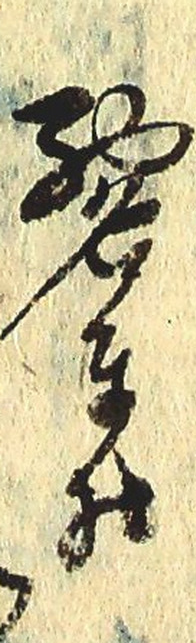西名東村
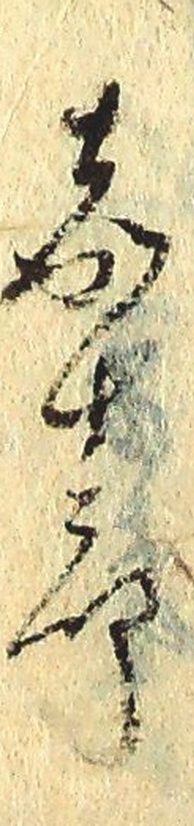嘉十郎
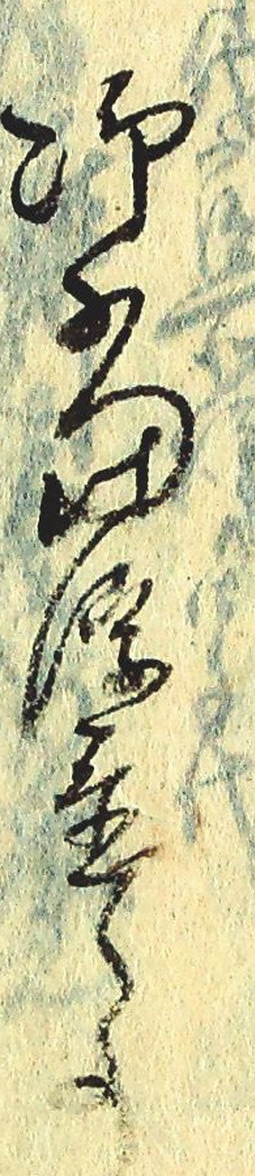御当浮置之事
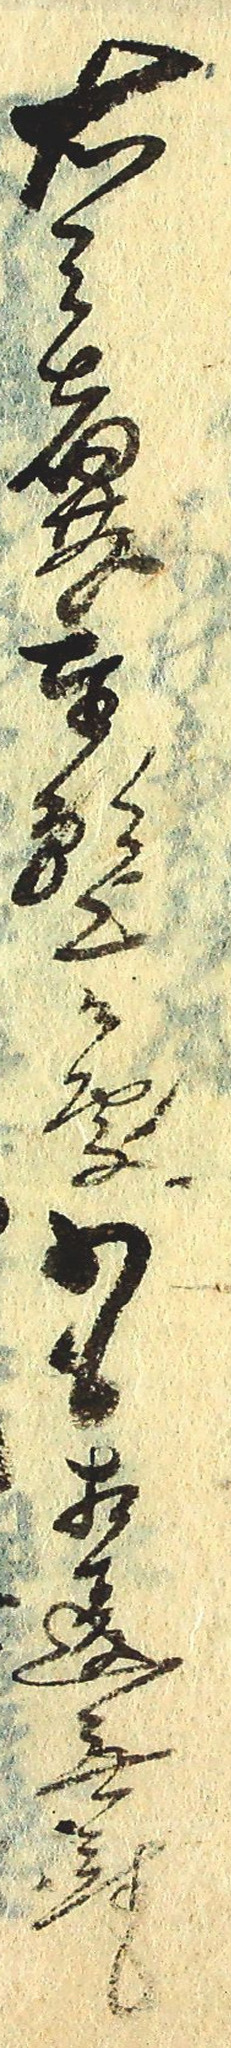右之者共奉願上候処少も相違無御座候
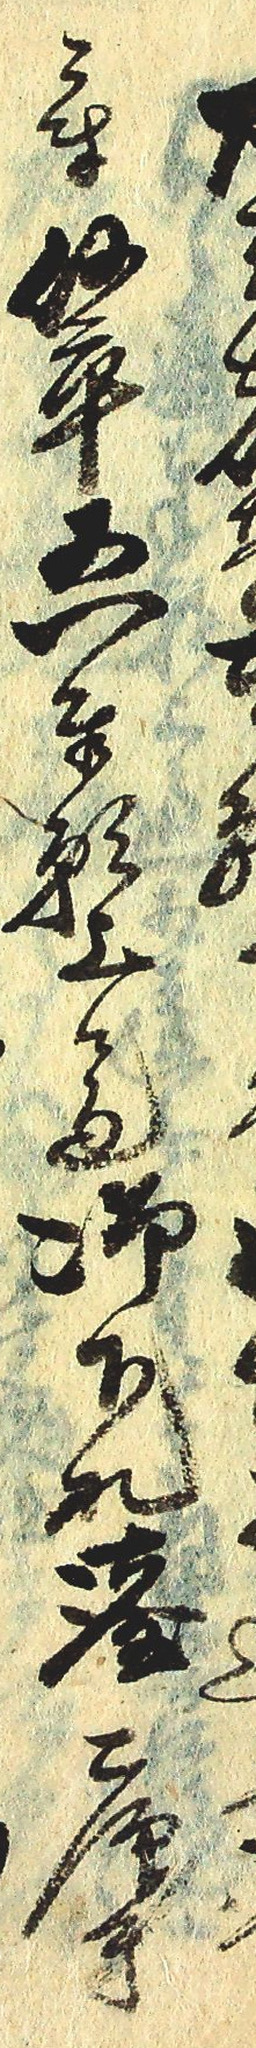に付何卒右奉願上候通御下札御渡被仰付
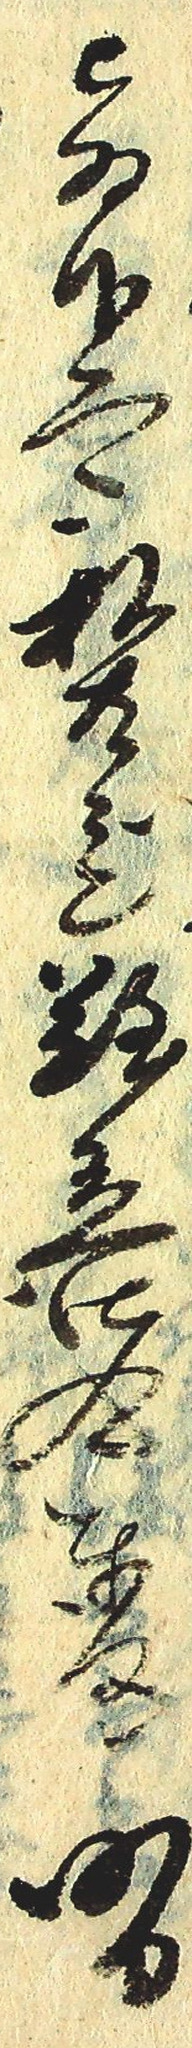被為下候はゝ私共迄難有仕合奉存候仍て
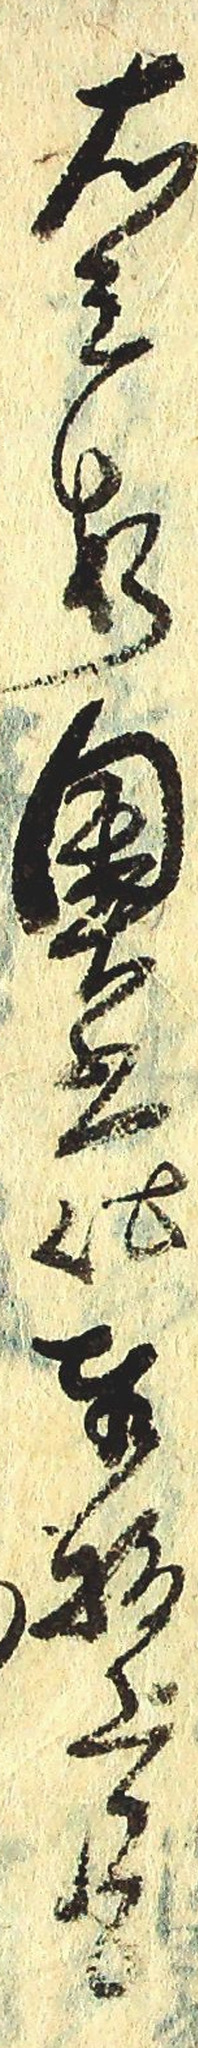右之段奥書仕奉指上候以上
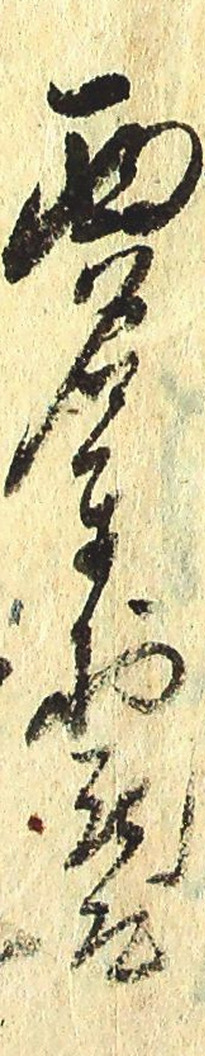西名東村庄屋
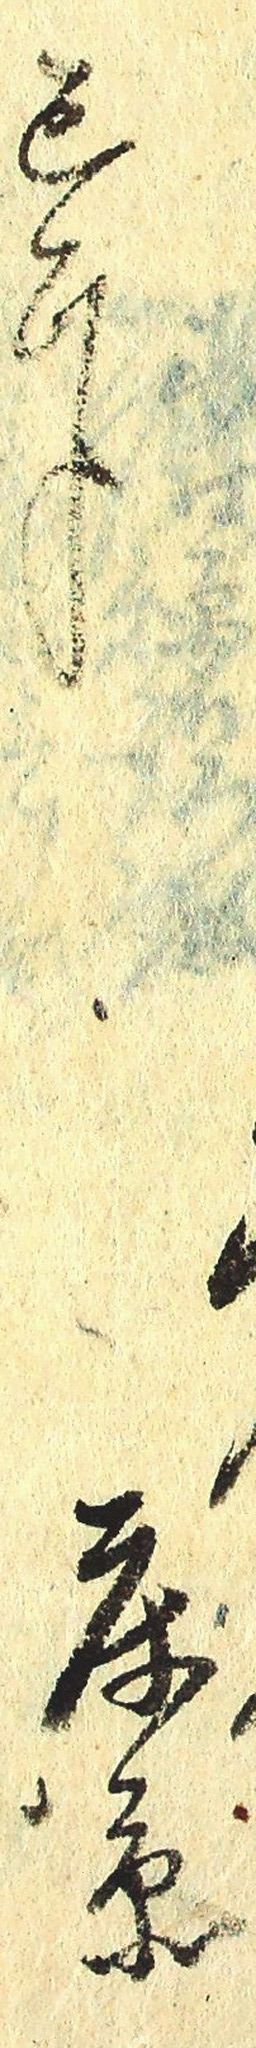巳正月茂兵衛

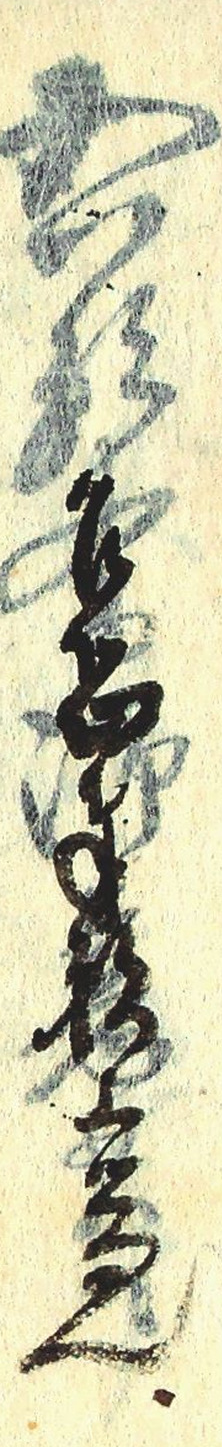乍恐奉願上覚
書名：諸御願書控(弐番）
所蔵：鳴門教育大学 Naruto University of Education
